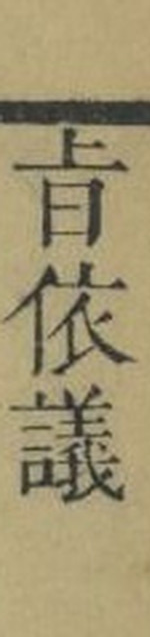㫖依議
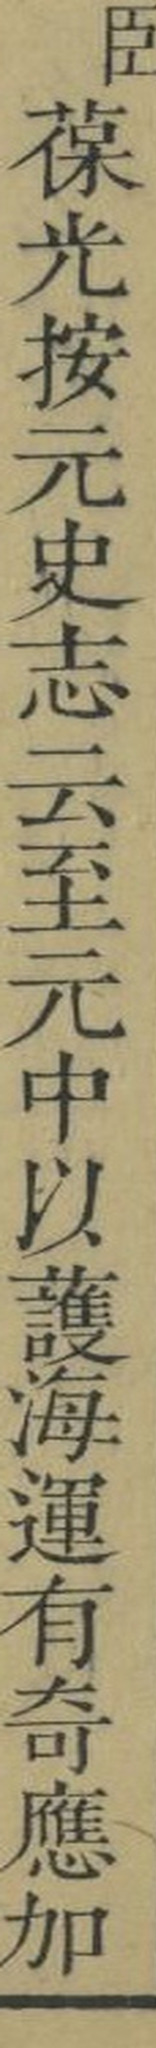臣葆光按元史志云至元中以䕶海運有奇應加
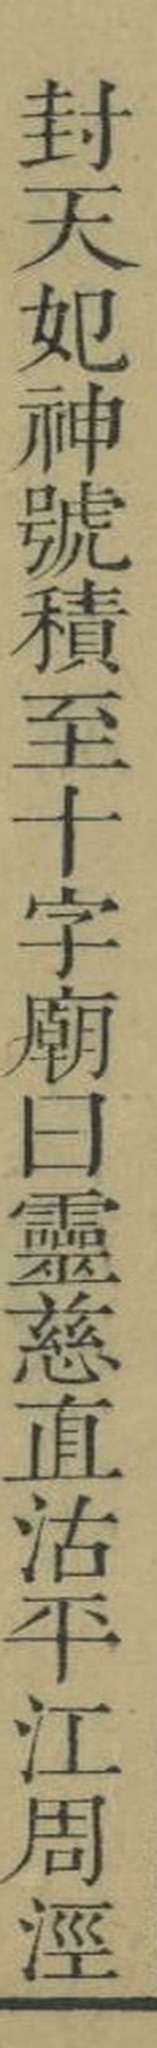封天妃神號積至十字廟曰靈慈直沽平江周涇
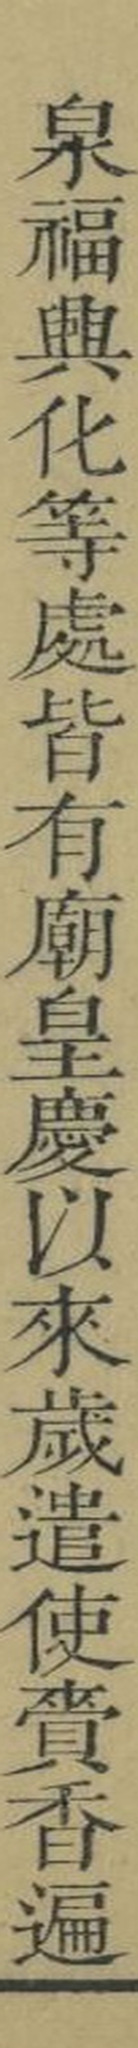泉福興化等處皆有廟皇慶以來歲遣使賫香遍
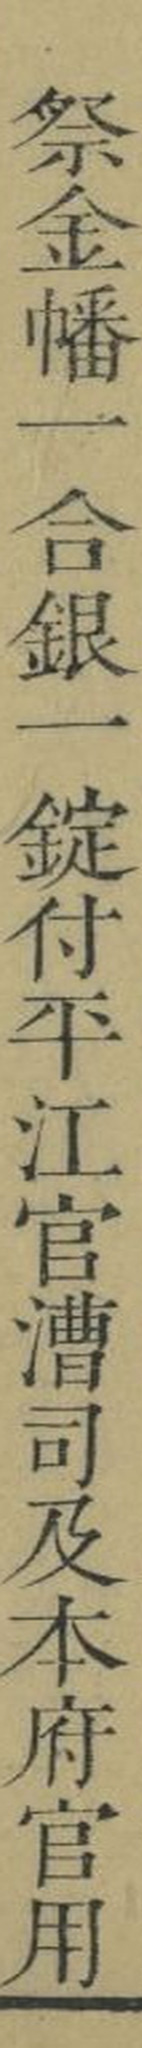祭金幡一合銀一錠付平江官漕司及本府官用
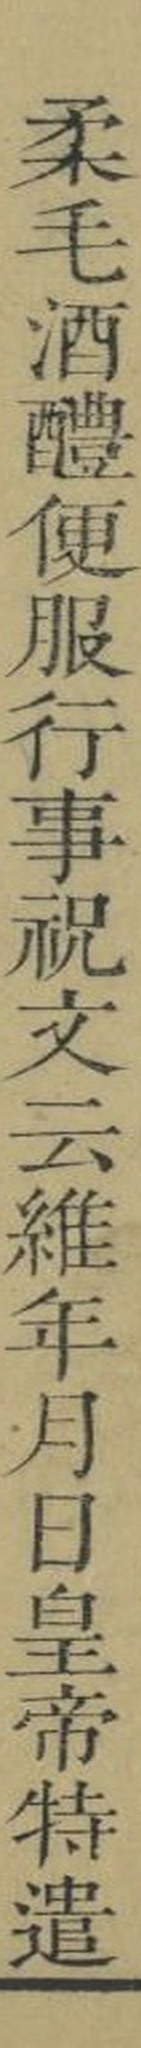柔毛酒醴便服行事祝文云維年月日皇帝特遣
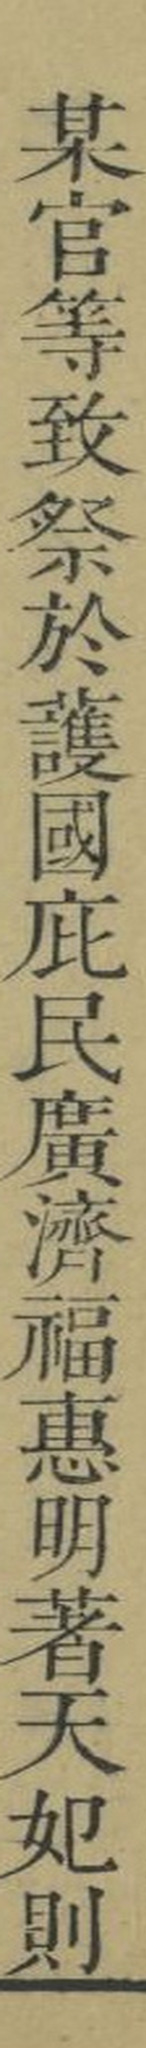某官等致祭於䕶國庇民廣濟福惠明著天妃則
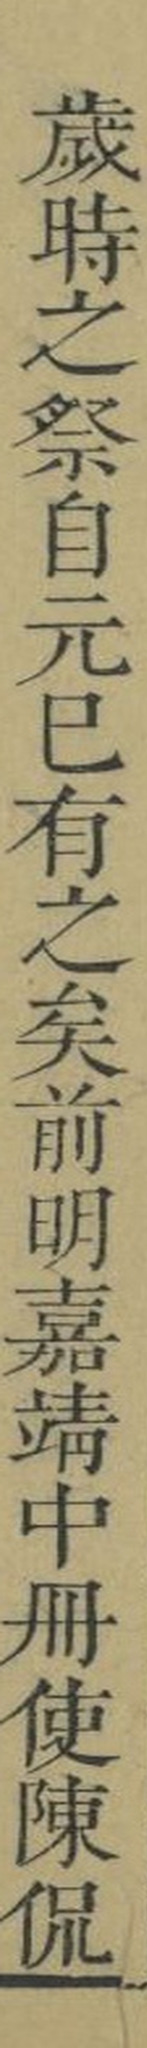歲時之祭自元巳有之矣前明嘉靖中冊使陳侃
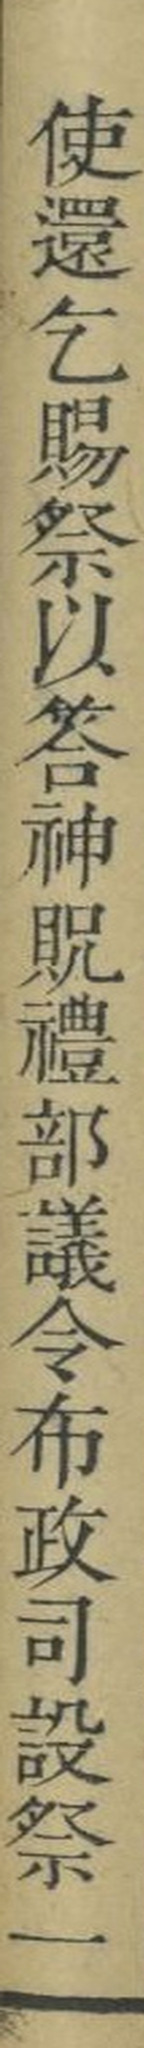使還乞賜祭以答神貺禮部議令布政司設祭一
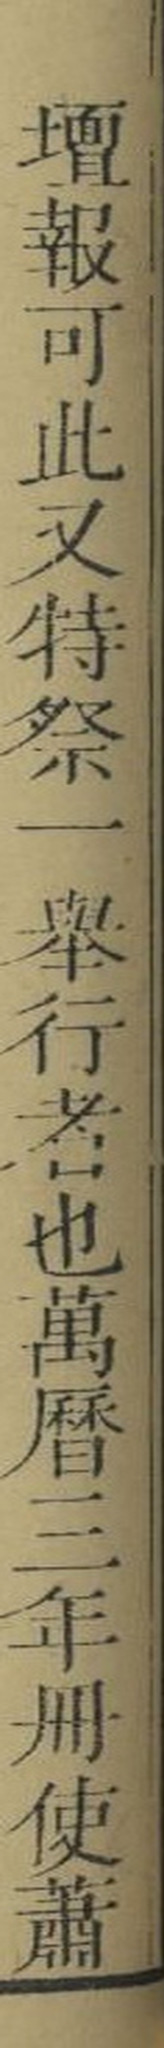壇報可此又特祭一舉行者也萬曆三年冊使蕭
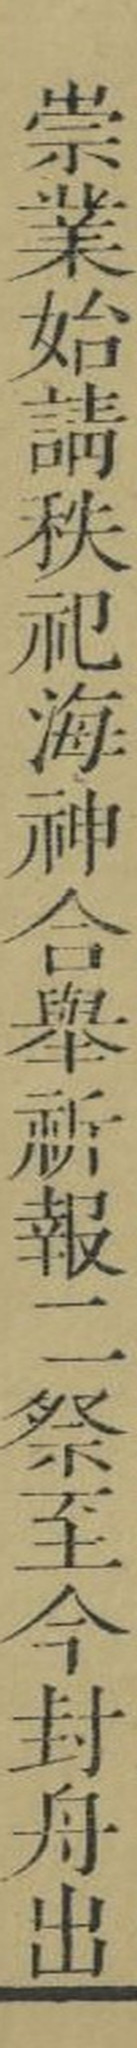崇業始請秩祀海神合舉祈報二祭至今封舟出
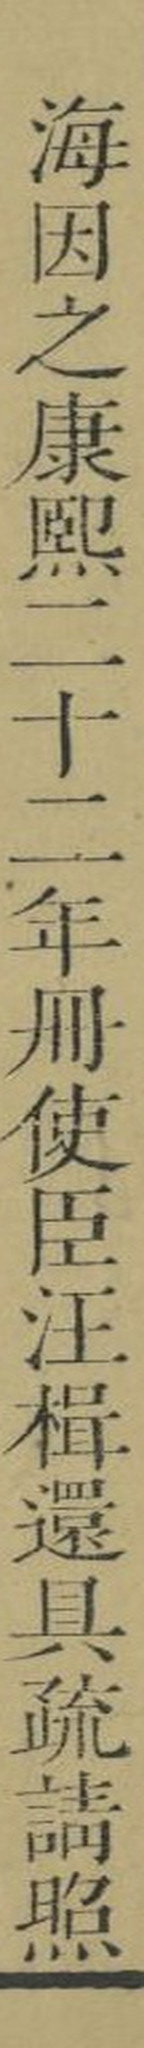海因之康熙二十二年冊使臣汪楫還具疏請照
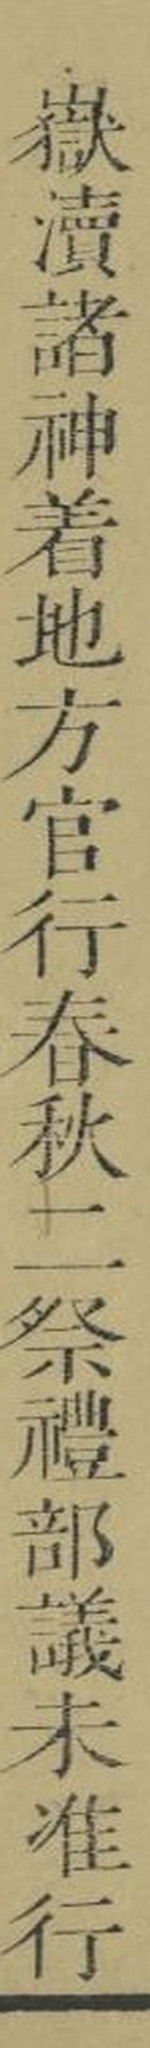嶽瀆諸神着地方官行春秋二祭禮部議未准行
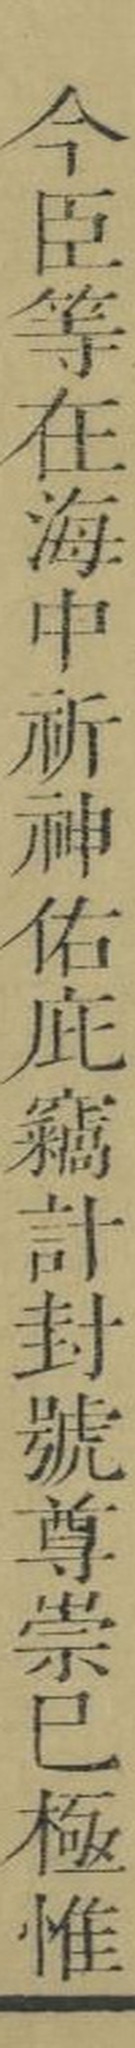今臣等在海中祈神佑庇竊計封號尊崇巳極惟
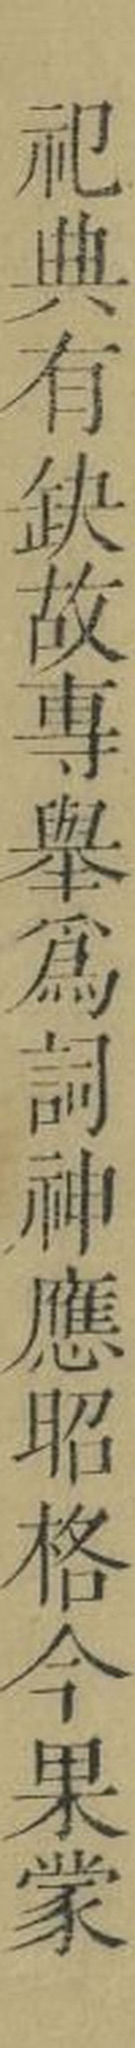祀典有缺故專舉爲詞神應昭格今果蒙
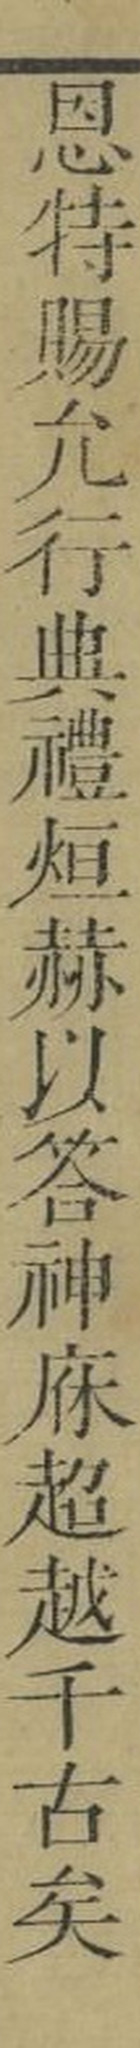恩特賜允行典禮烜赫以答神庥超越千古矣
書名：中山伝信録 巻一
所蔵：University of the Ryukyus Library
